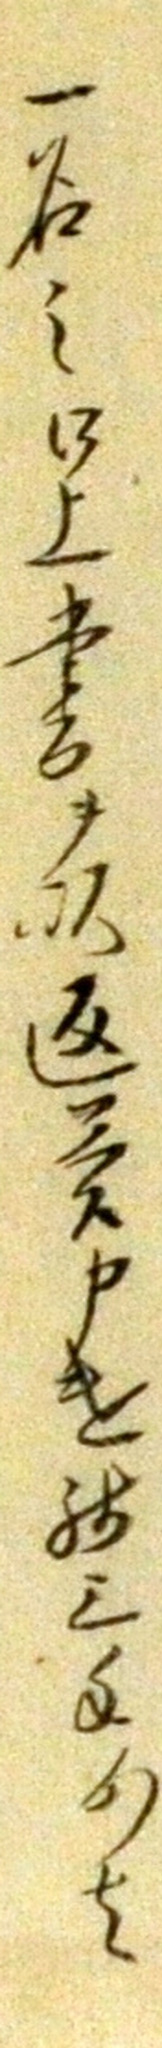一名之口上書ヲ以返答申遣残三手ゟ者
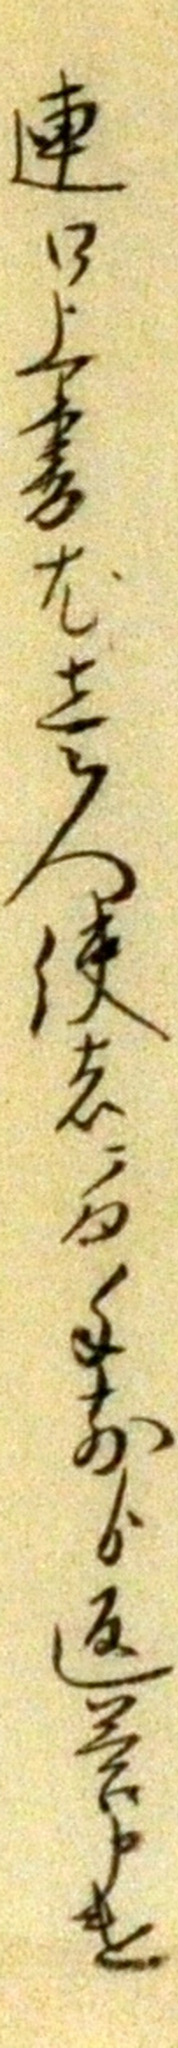連口上書尤壱人使者ニ而手前ゟ返答申遣
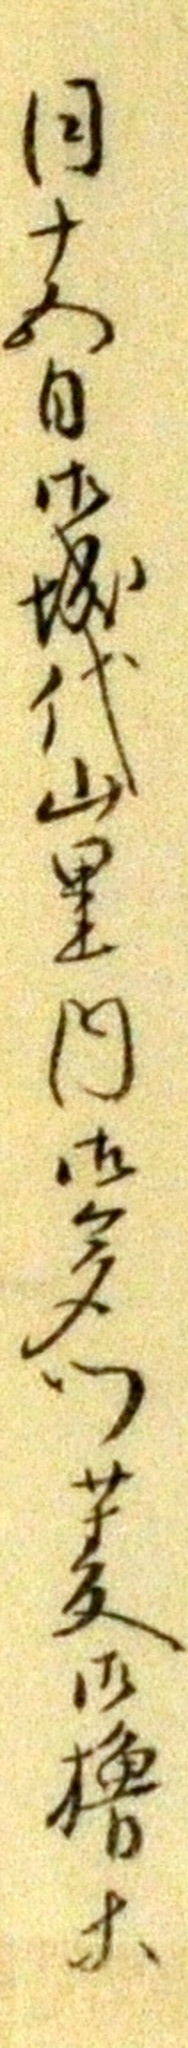同十五日御城代山里内御多門菱御櫓等
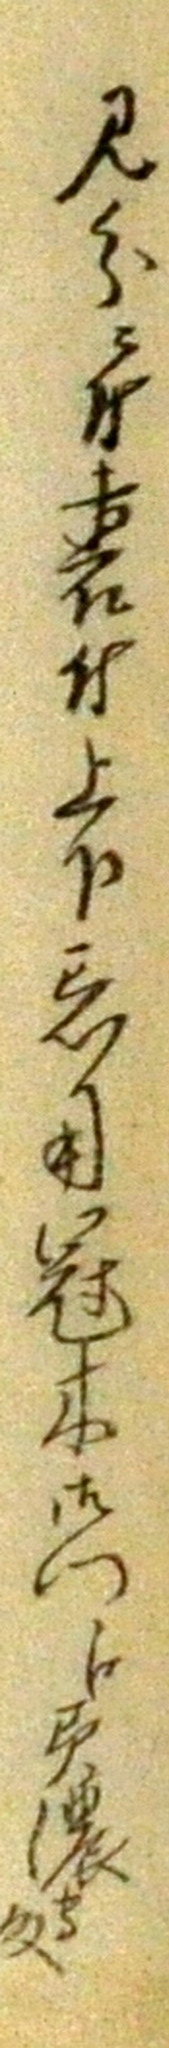見分ニ付裏付上下着用冠木御門江美濃守殿
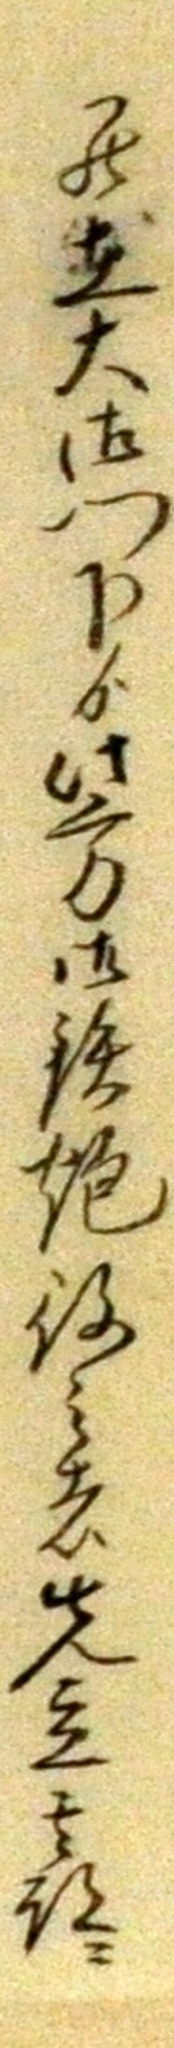罷在大御門下ゟ此方御鉄砲役之者先立其跡ニ
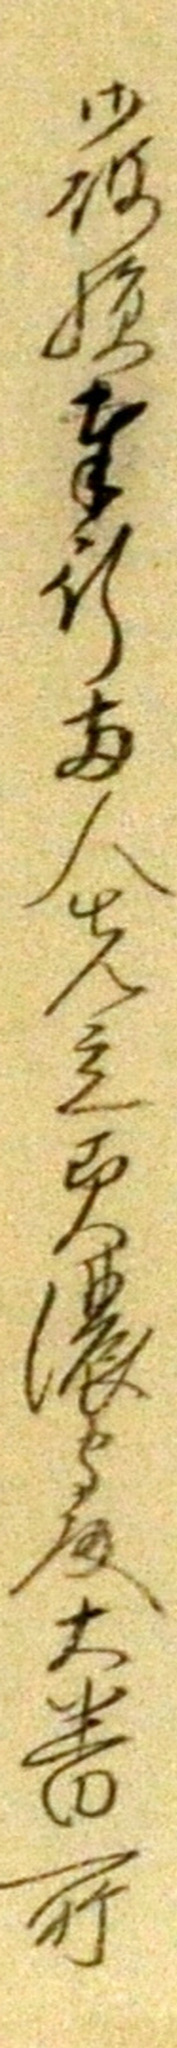御破損奉行両人先立美濃守殿大番所
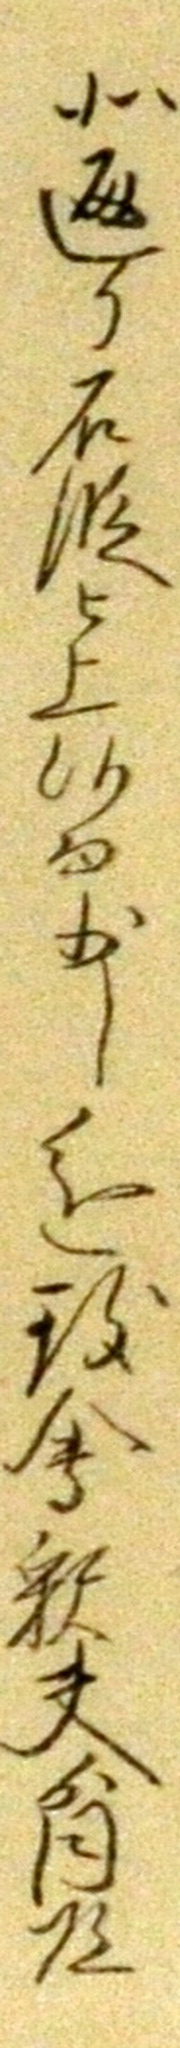北通り石段被上候而少し進致会釈夫ゟ同道
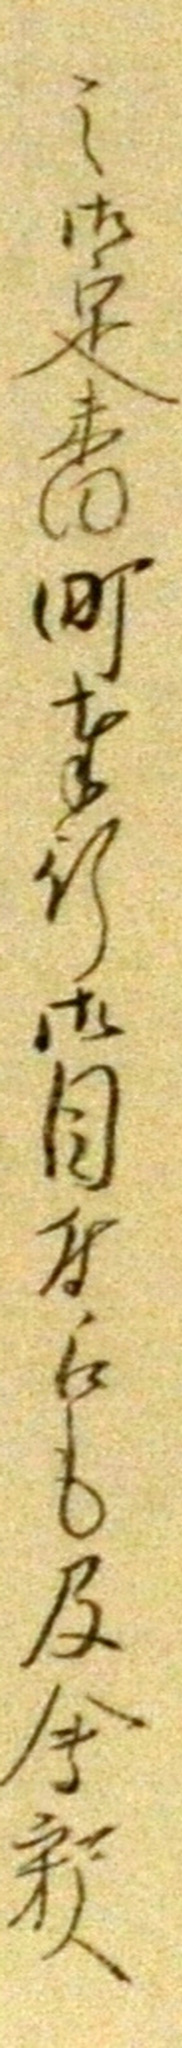之御定番町奉行御目付江も及会釈
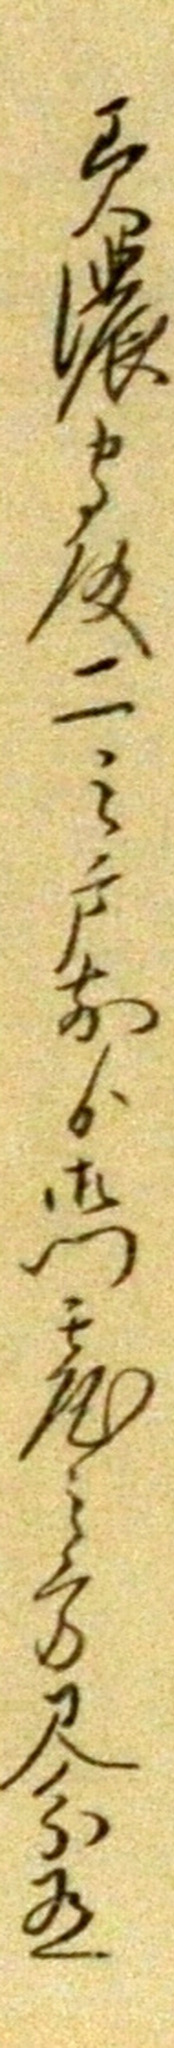美濃守殿二之戸前ゟ御門台之方見分有
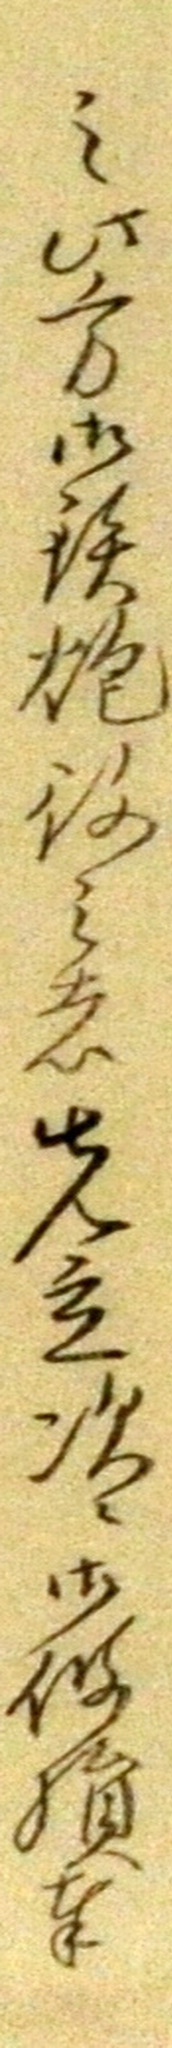之此方御鉄砲役之者先立次ニ御破損奉
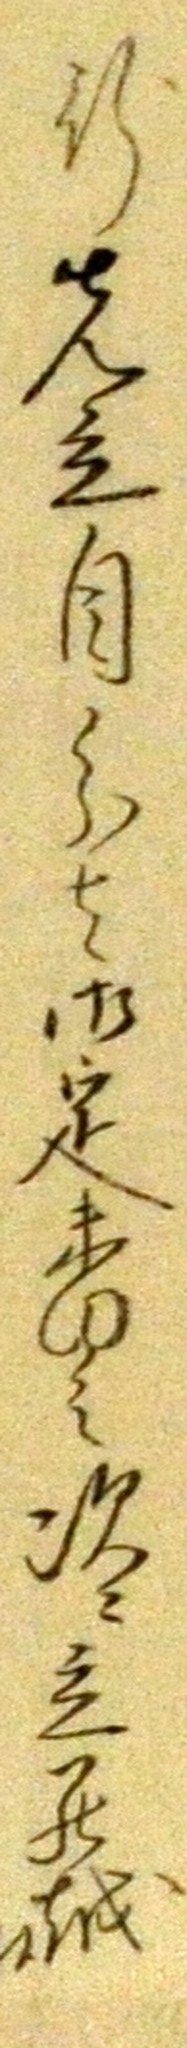行先立自分は御定番之次ニ立罷越候
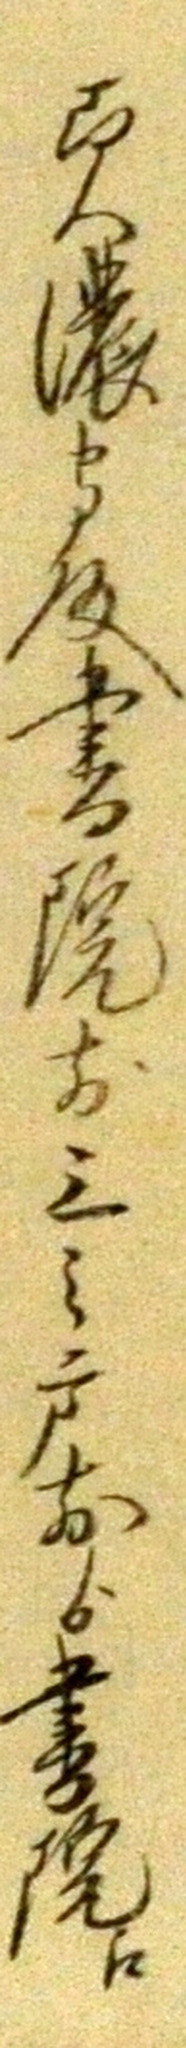美濃守殿書院前三之戸前ゟ書院江
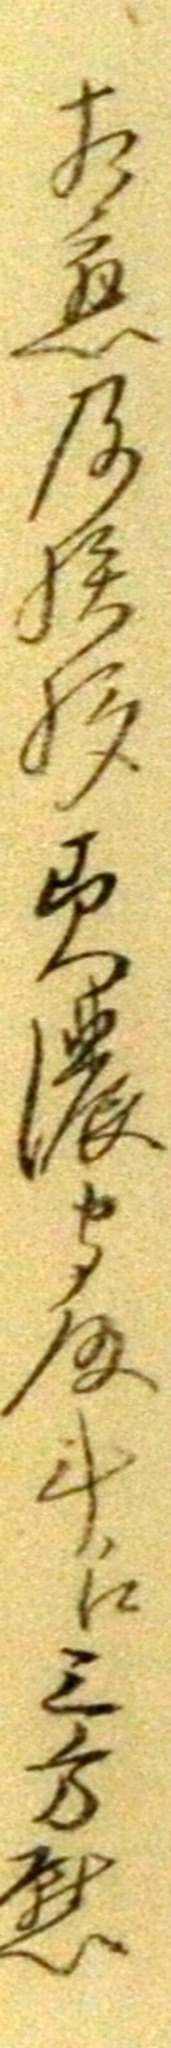相応及挨拶美濃守殿計江三方熨

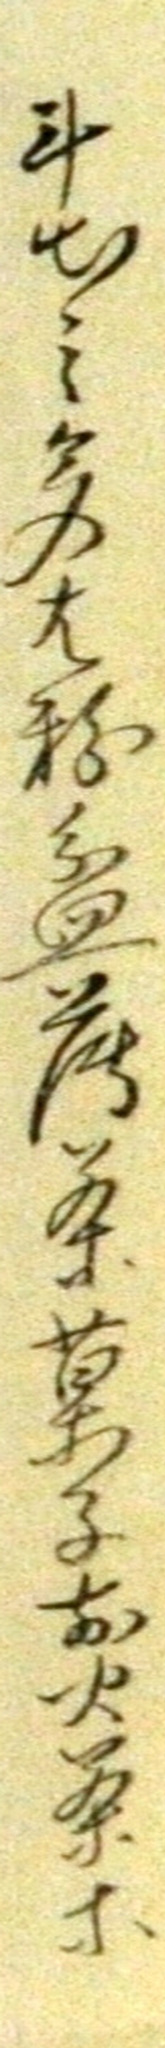斗出之たは粉盆薄茶菓子煎茶等
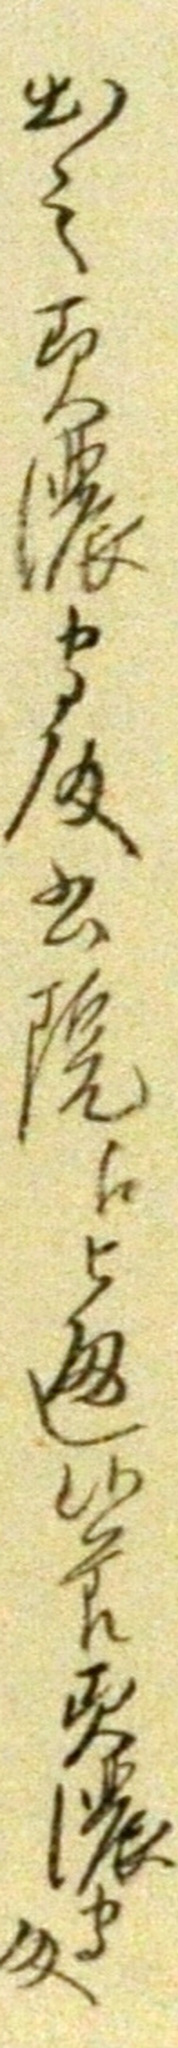出之美濃守殿書院え被通候節美濃守殿
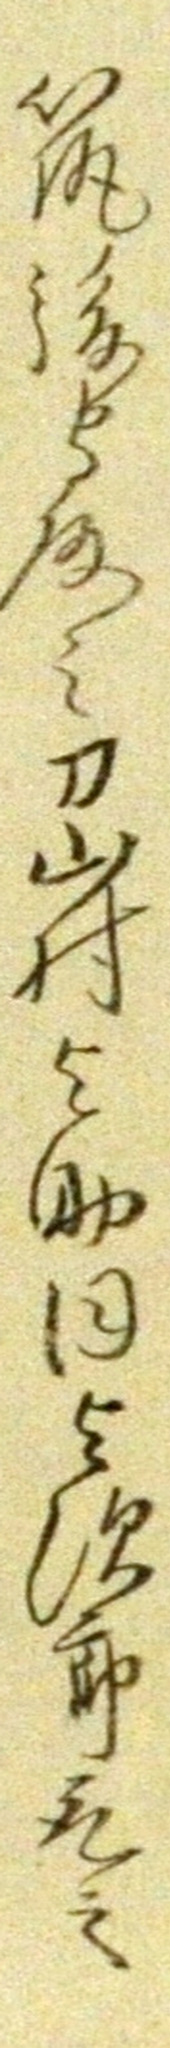筑後守殿之刀山村与助同与次郎取之
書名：大阪加番関係諸書留〔一括〕
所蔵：伊那市立高遠町図書館・合同会社AMANE
